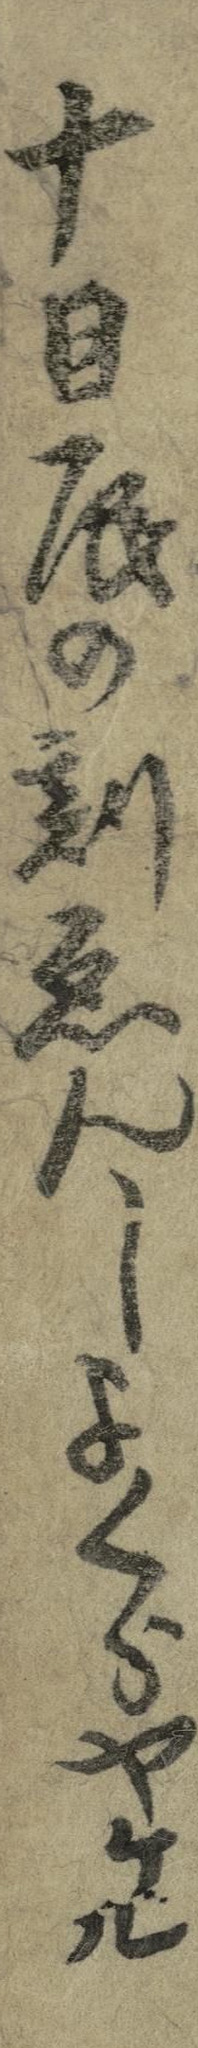十日辰の刻ゑんしよくらヤケル
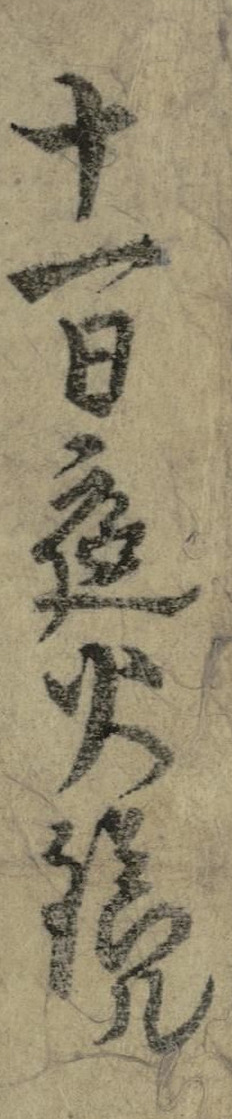十一日夜火鎮ル
